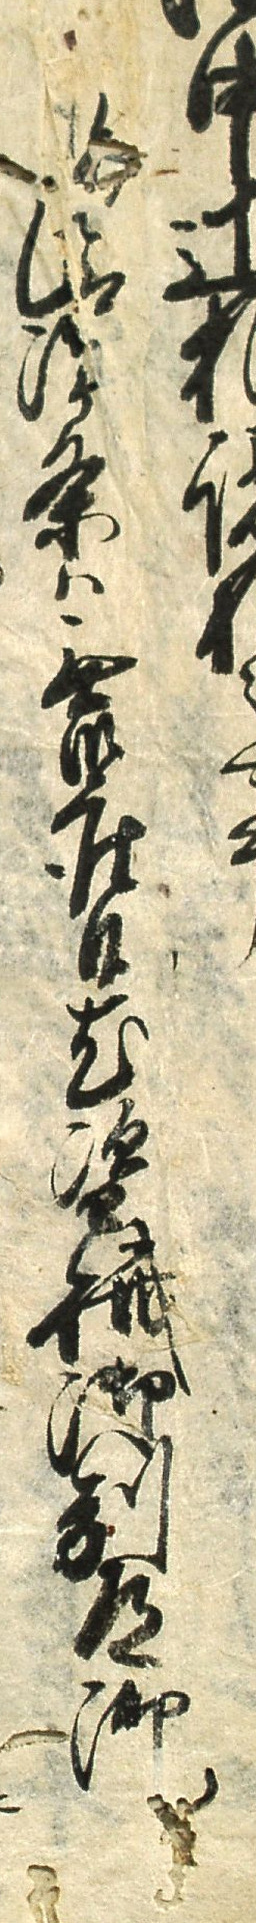此御ヶ条ハ無御座候尤盗賊御制道御
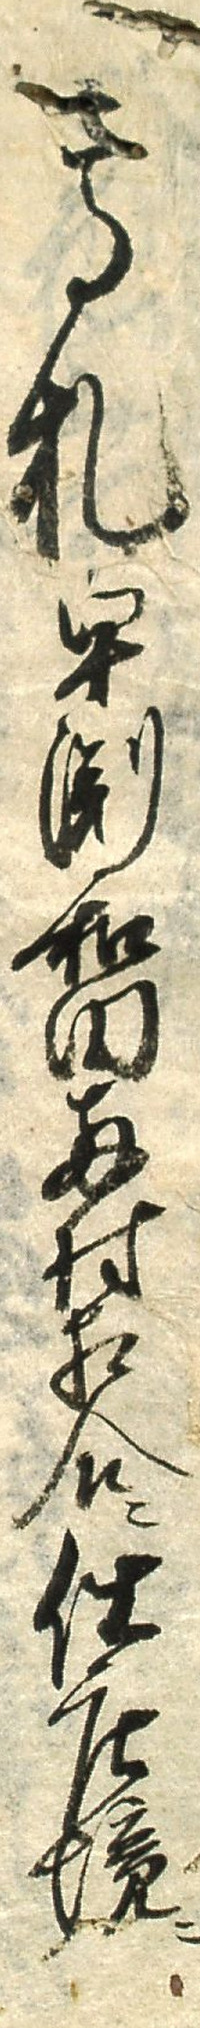高札早渕和田両村相合ニ仕庄境ニ
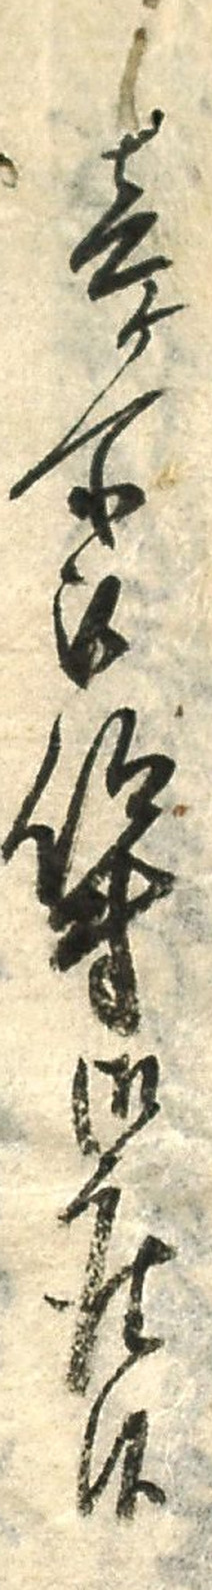壱ヶ所被仰付御座候
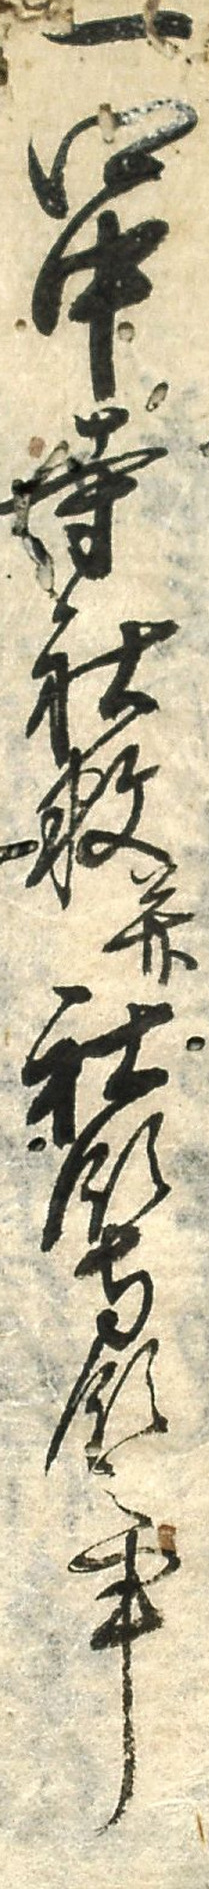一郷中寺社数幷社領寺領之事
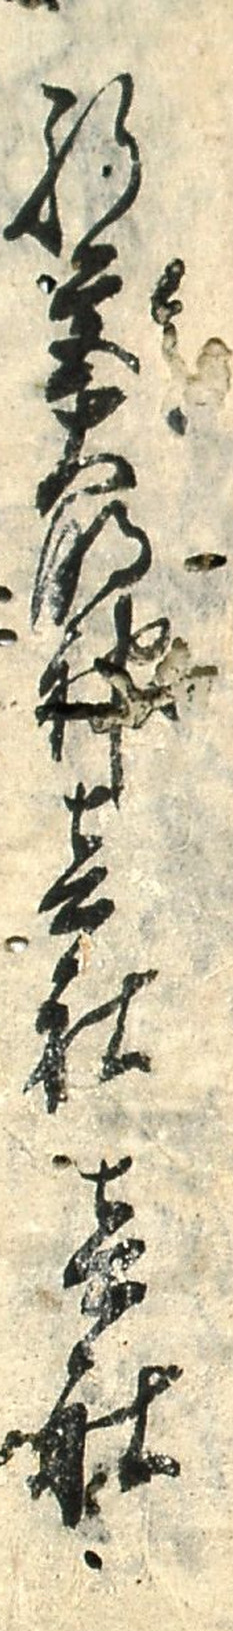新宮大明神壱社壱社
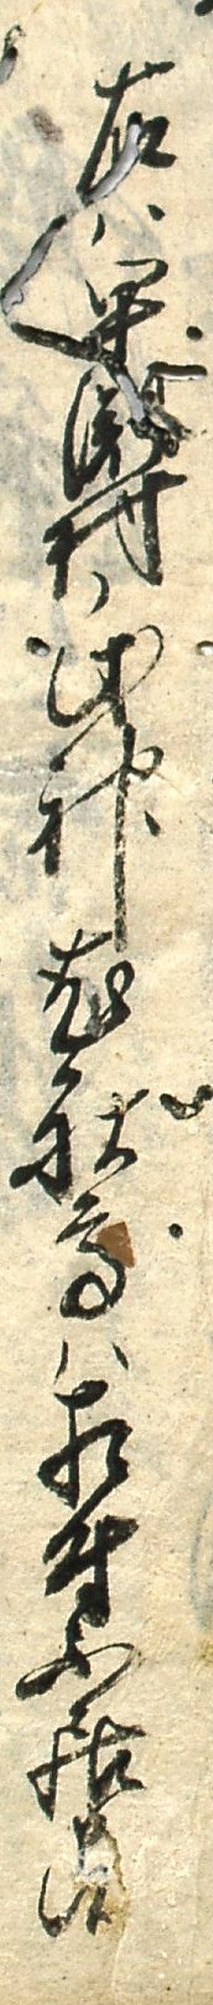右ハ早渕村ノ氏神尤社高ハ相付不居申候
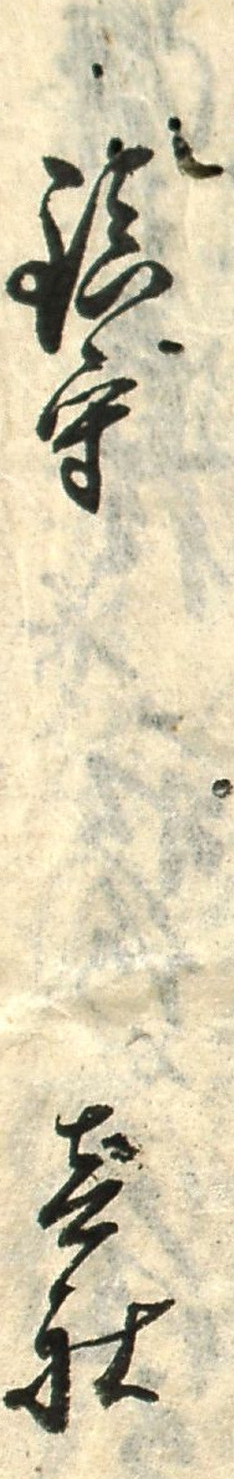鎮守壱社
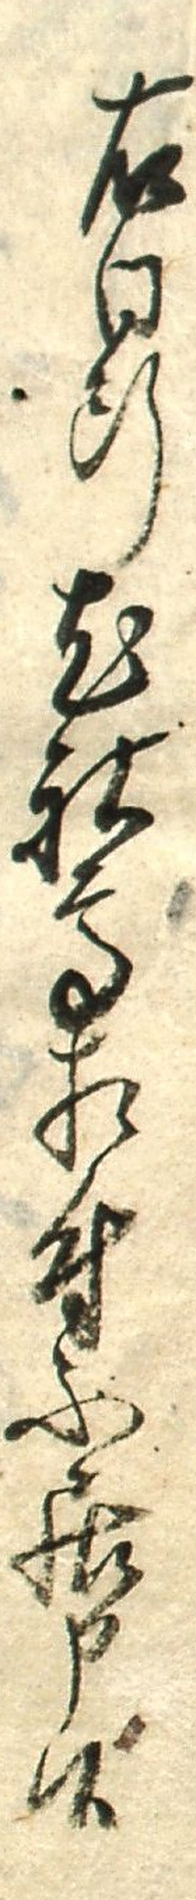右同断尤社高相付不居申候
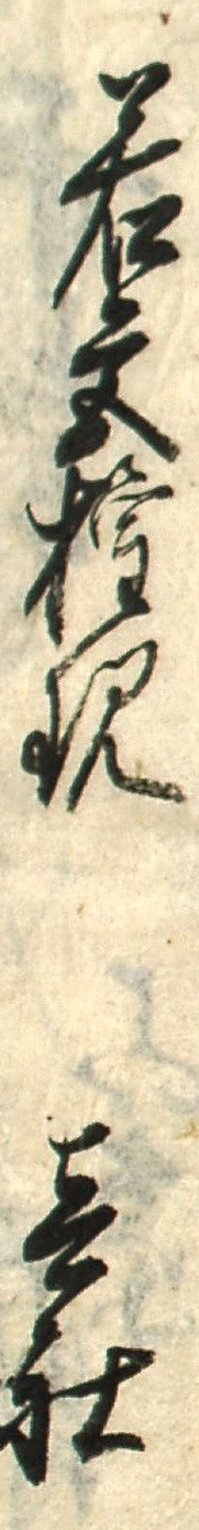若宮権現壱社
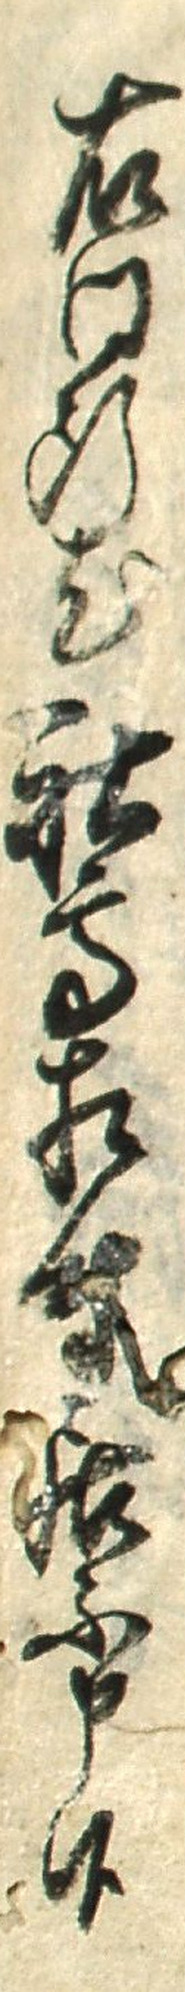右同断尤社高相付不居申候

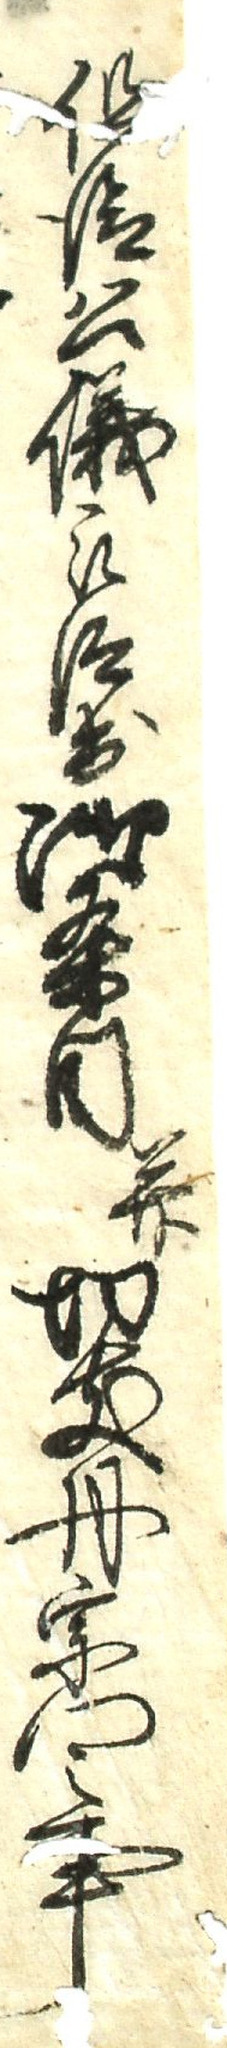但御公儀被仰出御条目幷切支丹宗門之事
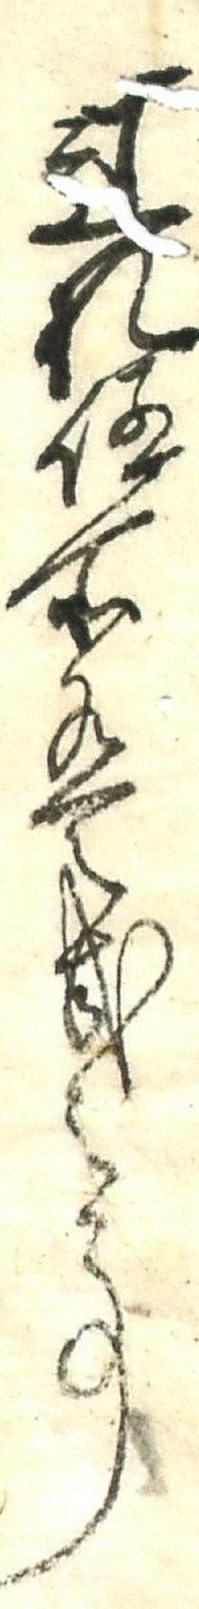辻札何ヶ所有之哉之事
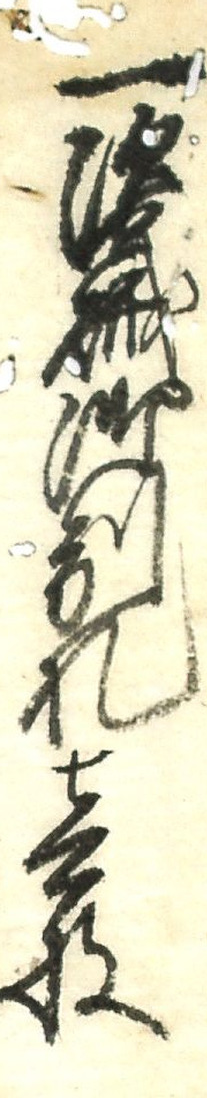一盗賊御制札壱枚
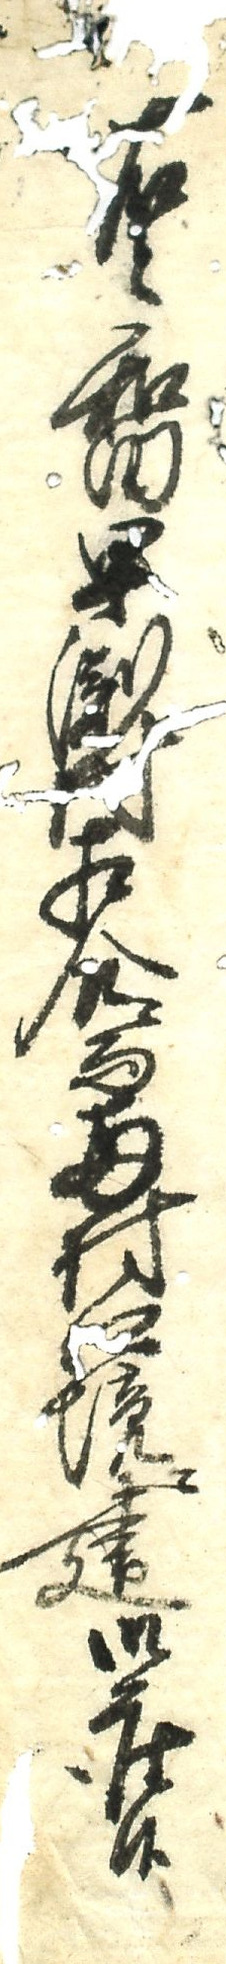右者和田早渕村相合ニ而両村郷境ニ建御座候
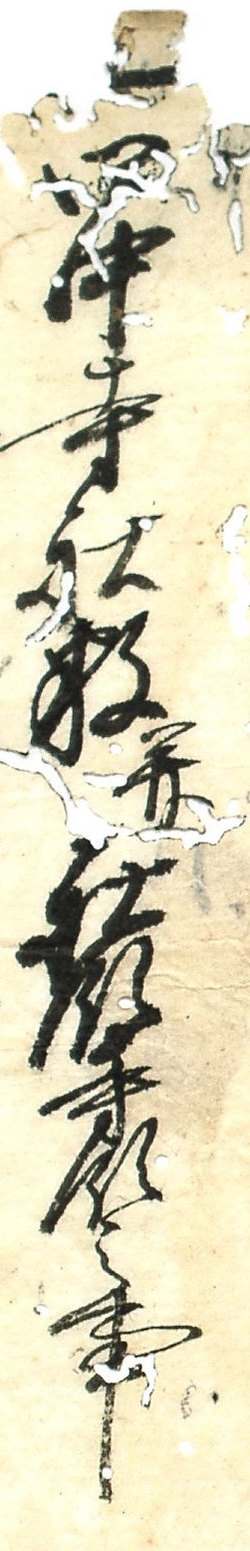一郷中寺社数幷社領寺領之事
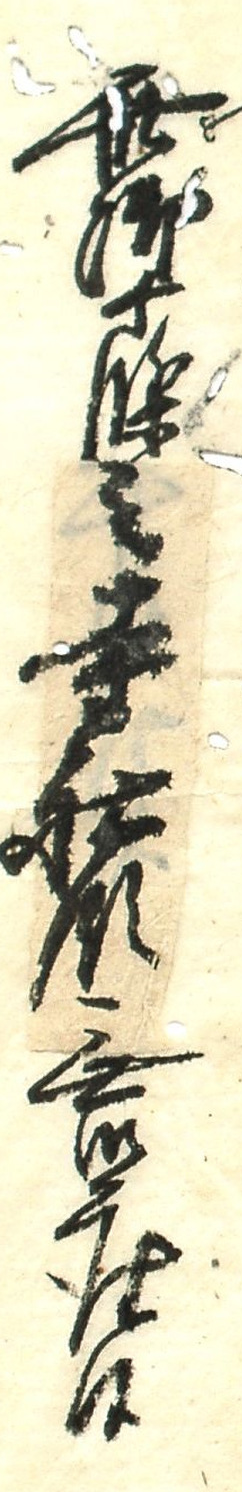此御ヶ條之寺社領無御座候
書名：御ヶ条ヲ以被仰附株々申上帳（早渕村控）
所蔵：鳴門教育大学 Naruto University of Education
